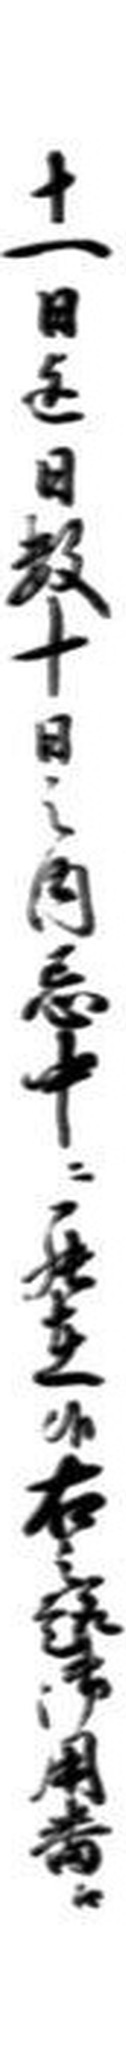十一日迄日数十日之内忌中ニ罷在候右之趣御用番江
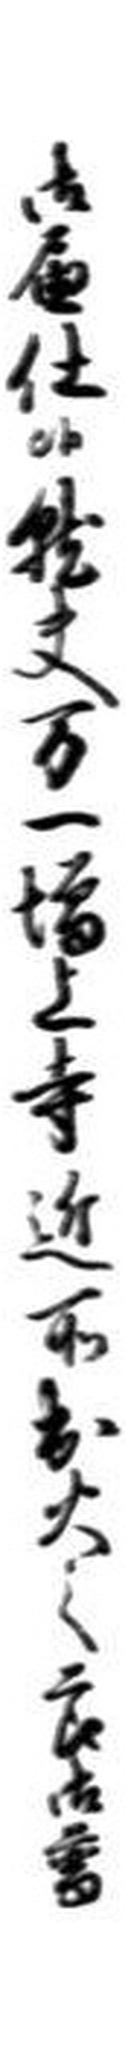御届仕候就夫万一増上寺近所出火之節御普
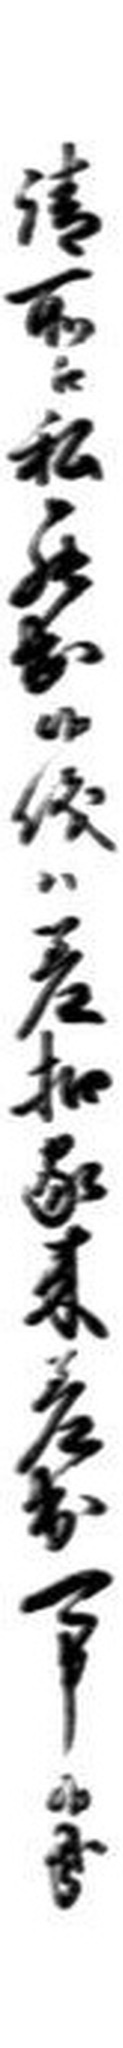請所江私罷出候儀ハ差控家来差出可申候哉

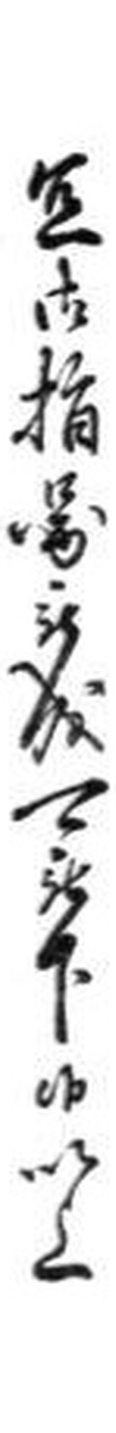宜御指図被成可被下候以上
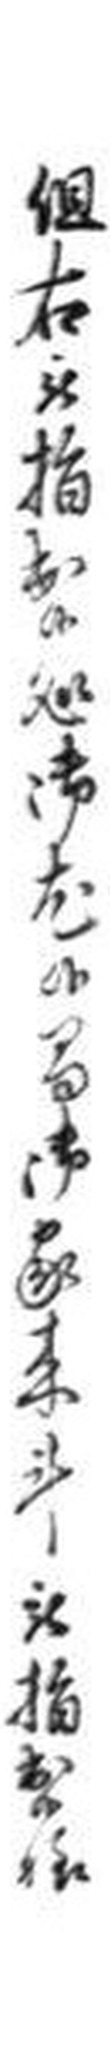但右被指出候処御尤候間御家来斗被指出候様
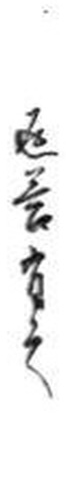返答有之
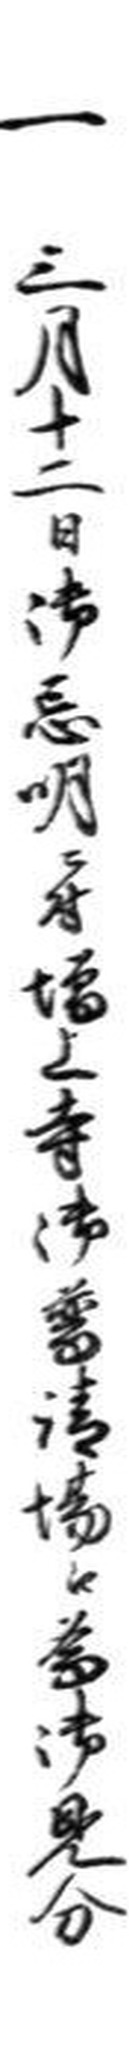一三月十二日御忌明ニ付増上寺御普請場江為御見分
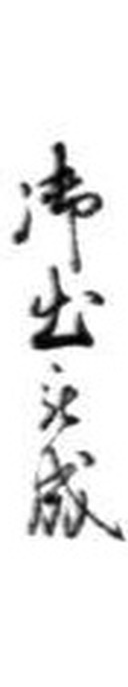御出被成
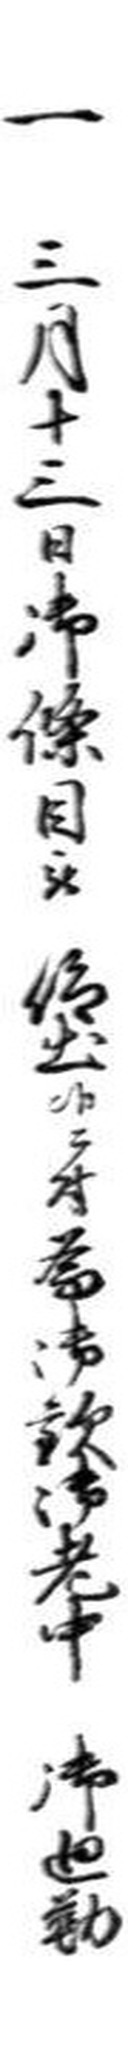一三月十三日御条目被仰出候ニ付為御歓御老中御廻勤
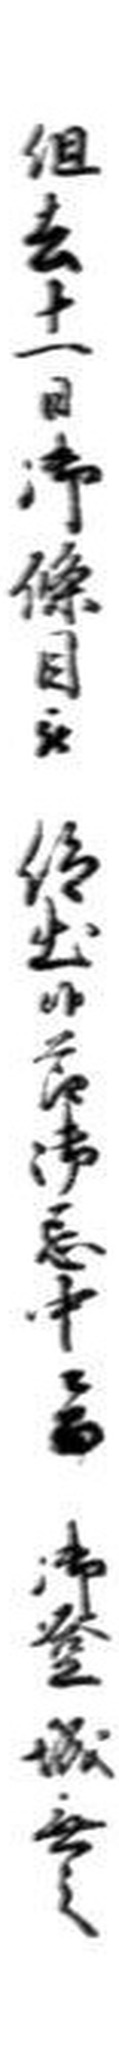但去十一日御条目被仰出候節御忌中ニ而御登城無之
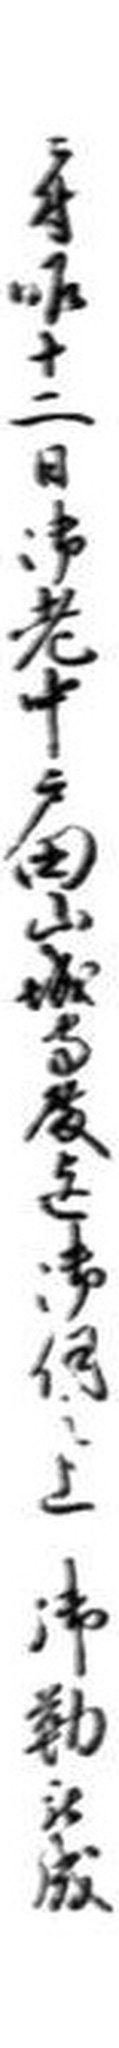ニ付昨十二日御老中戸田山城守殿迄御伺之上御勤被成
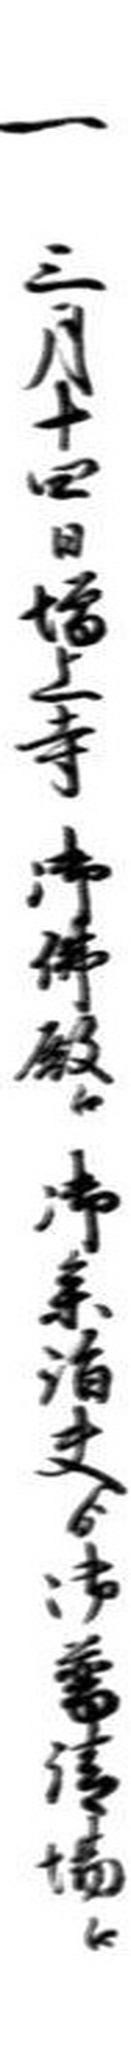一三月十四日増上寺御仏殿江御参詣夫ゟ御普請場江
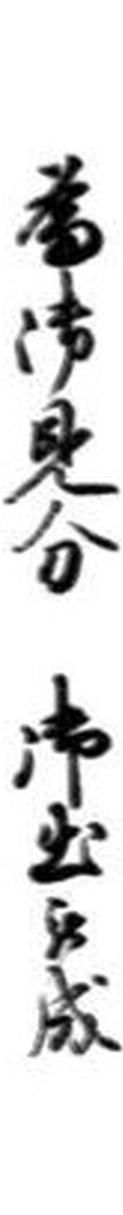為御見分御出被成
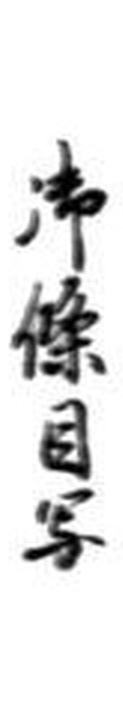御条目写
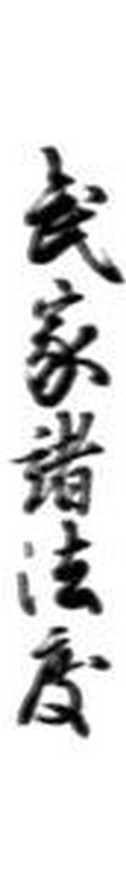武家諸法度
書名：家譜 三十二 吉邦公 従享保二年到享保三年
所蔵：福井県文書館 Fukui Prefectural Archives
